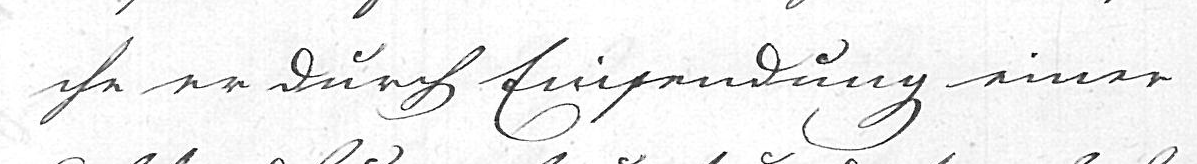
che er durch Einsendung einer
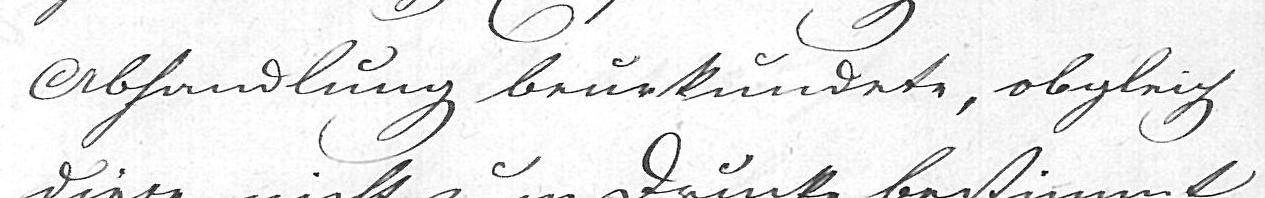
Abhandlung beurkundete, obgleich
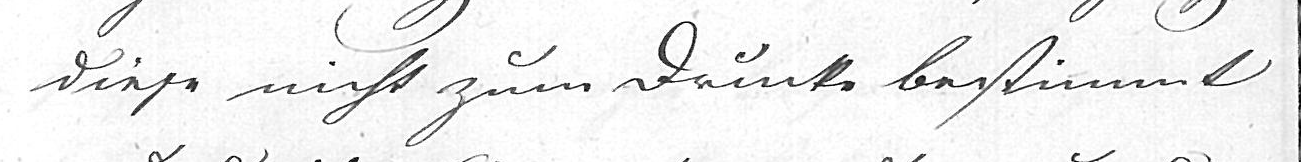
diese nicht zum Drucke bestimmt
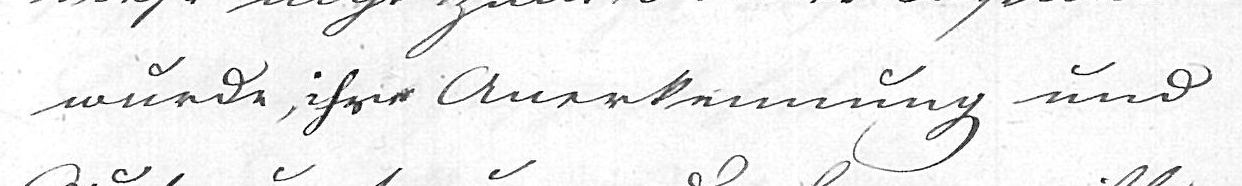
wurde, ihre Anerkennung und
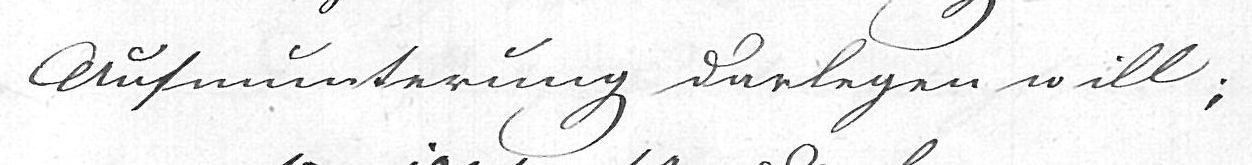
Aufmunterung darlegen will;
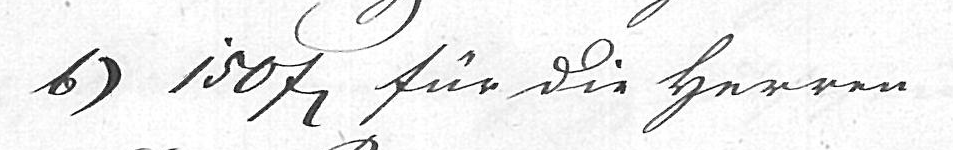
b) 150 fl für die Herren
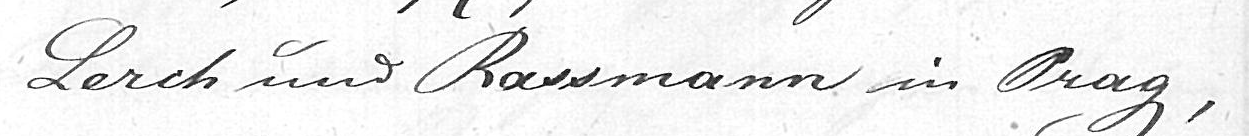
Lerch und Rassmann in Prag,
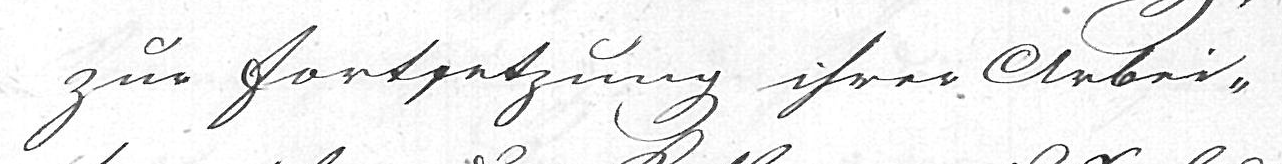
zur Fortsetzung ihrer Arbei-
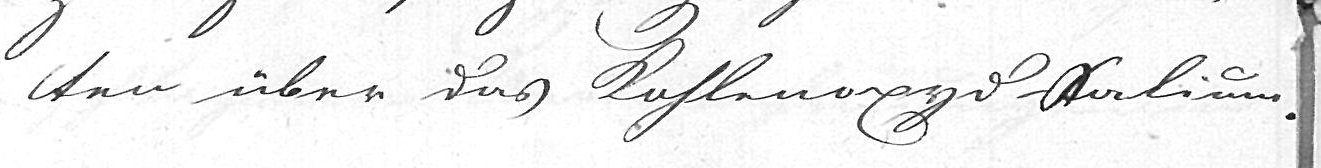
ten über das Kohlenoxyd-Calium,
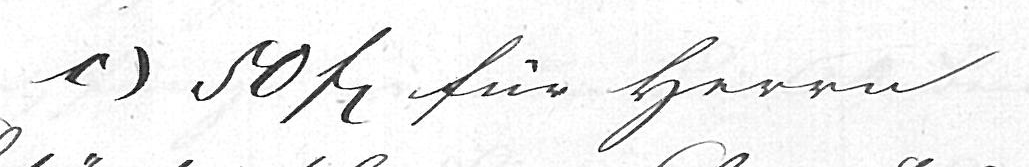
c) 50 fl für Herrn
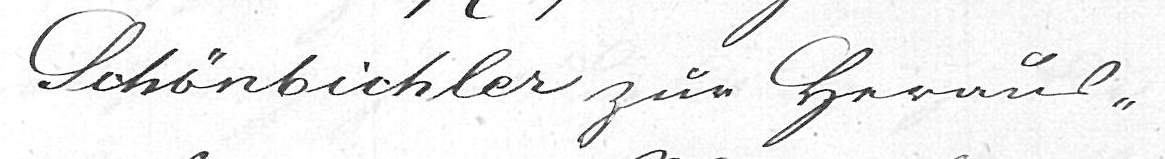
Schönbichler zur Heraus-
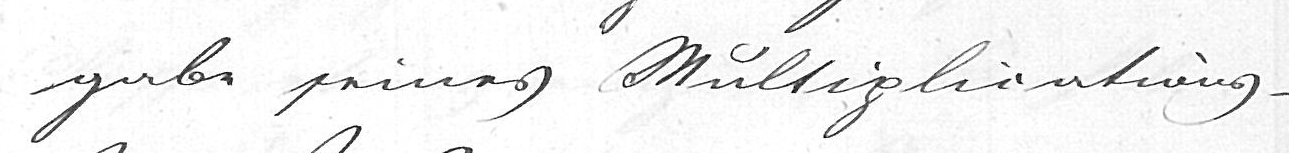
gabe seines Multiplications-
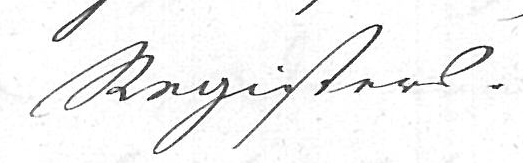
Registers.
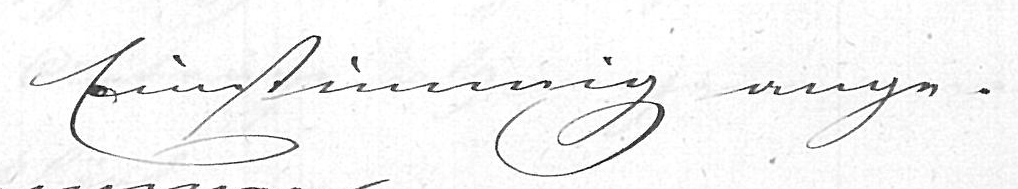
Einstimmig ange-
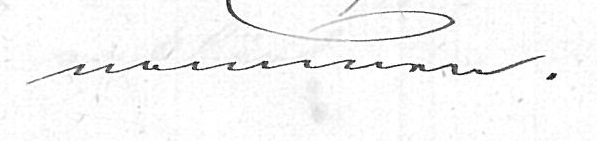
nommen.
